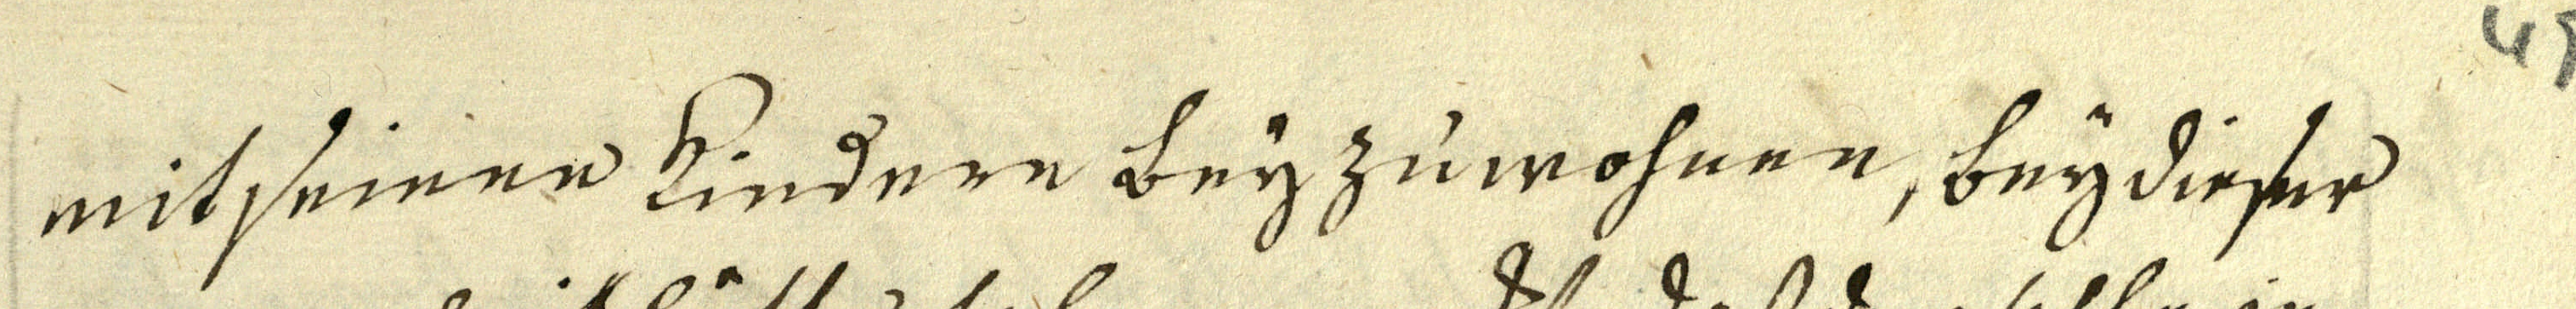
mit seinen Kindern beÿzuwohnen, beÿ dieser
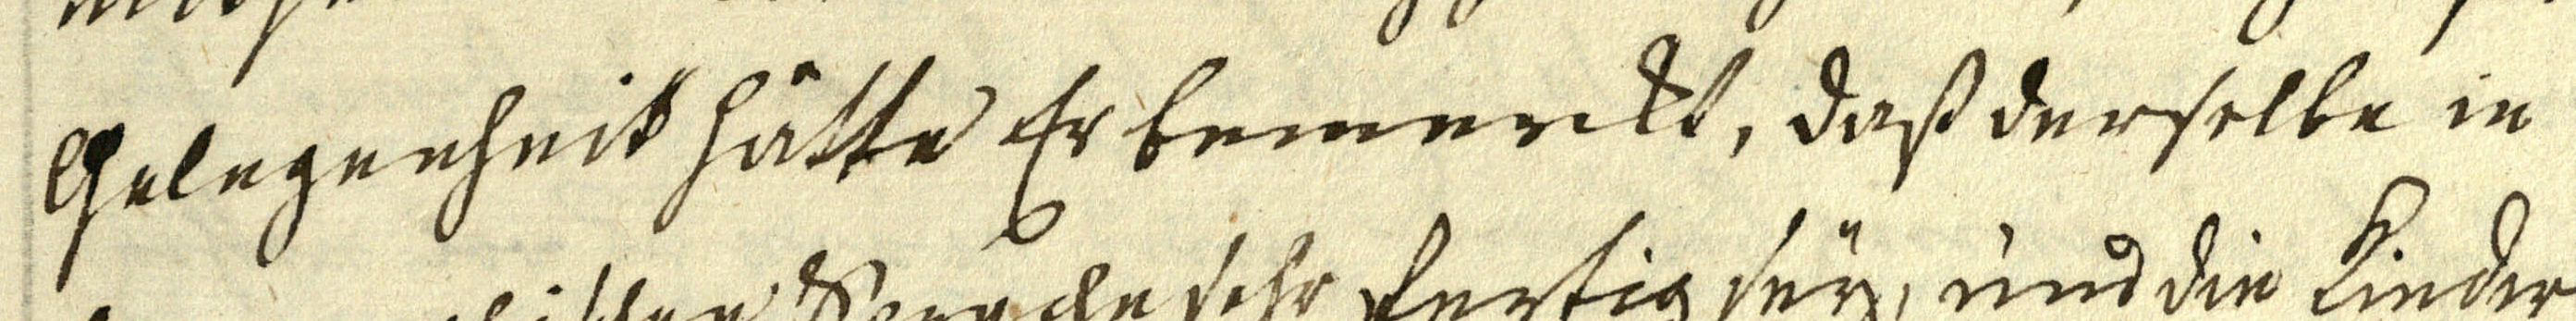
Gelegenheit hätte Er bemerckt, daß derselbe in
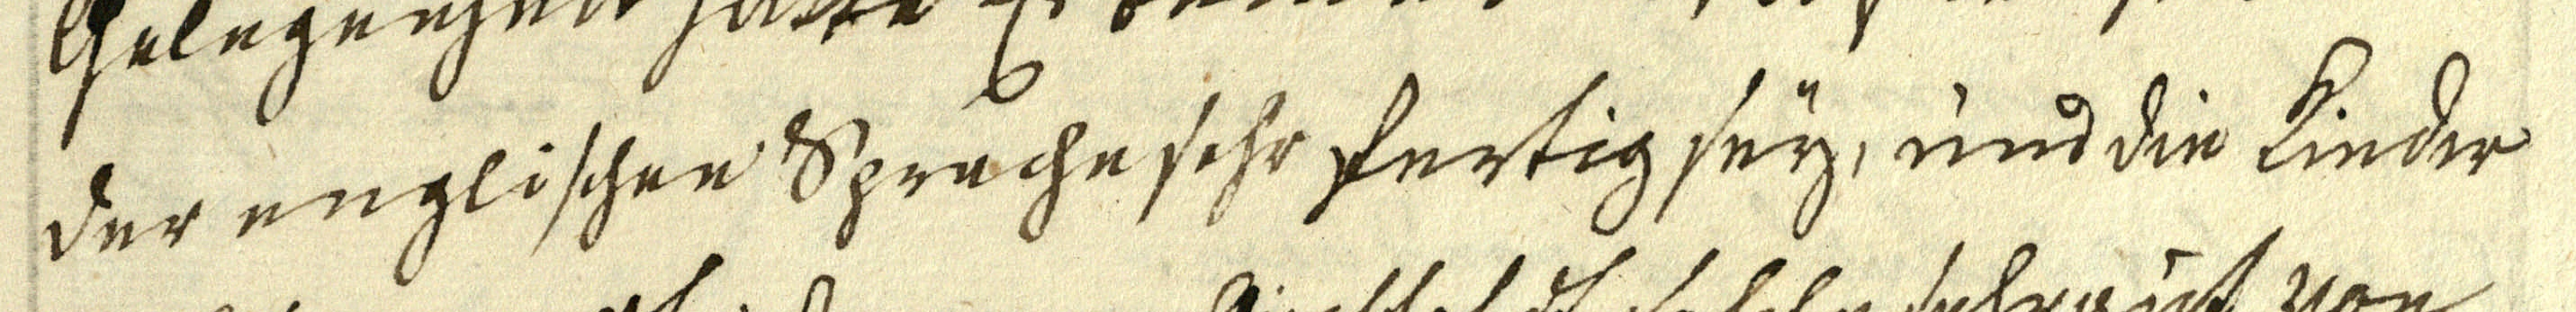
der englischen Sprache sehr fertig seÿ, und die Kinder
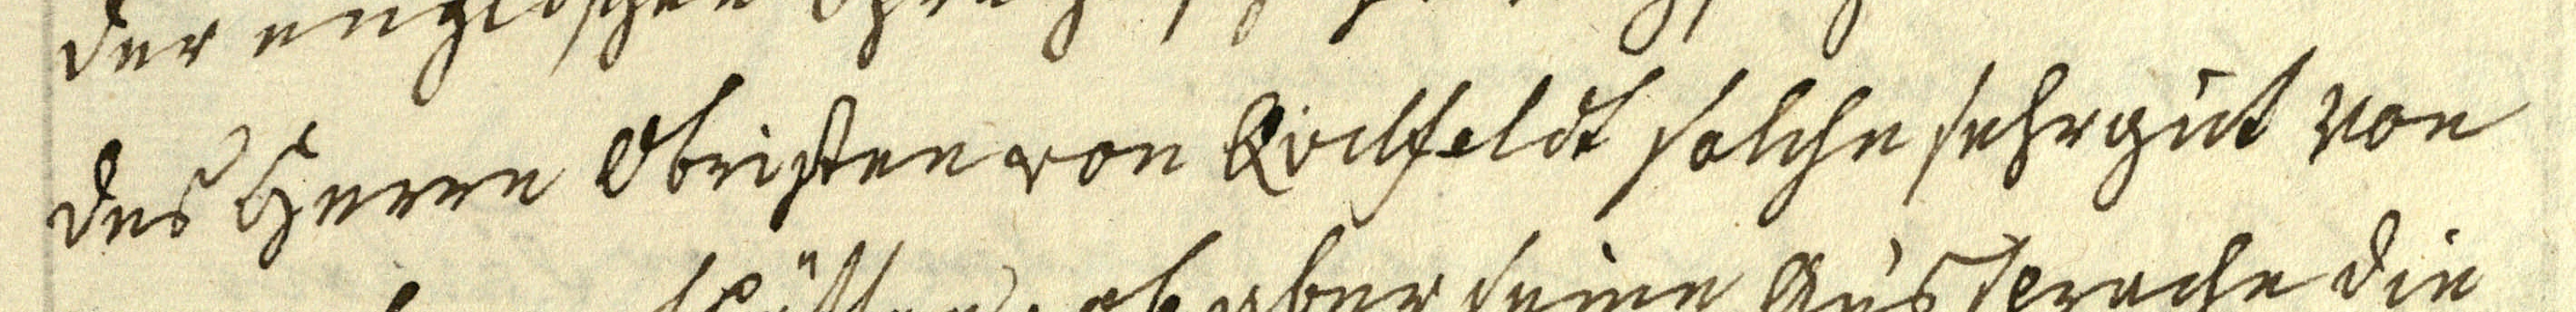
des Herrn Obristen von Quilfeldt solche sehr gut von
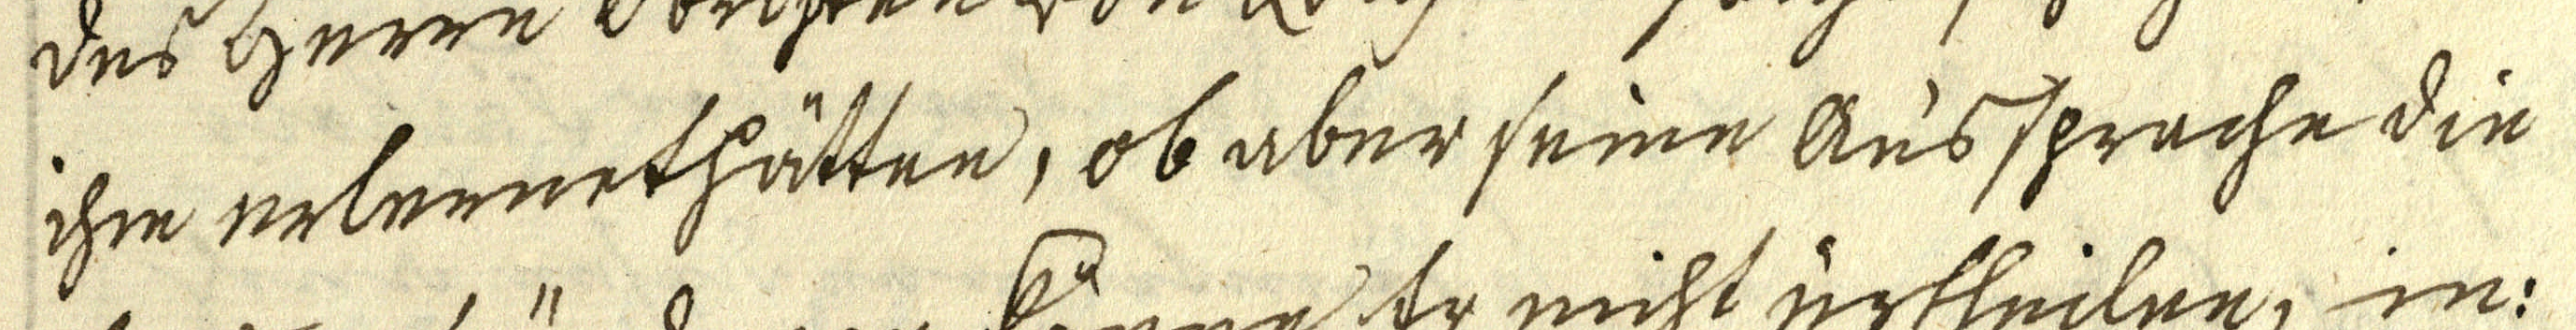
ihm erlernethätten, ob aber seine Aussprache die
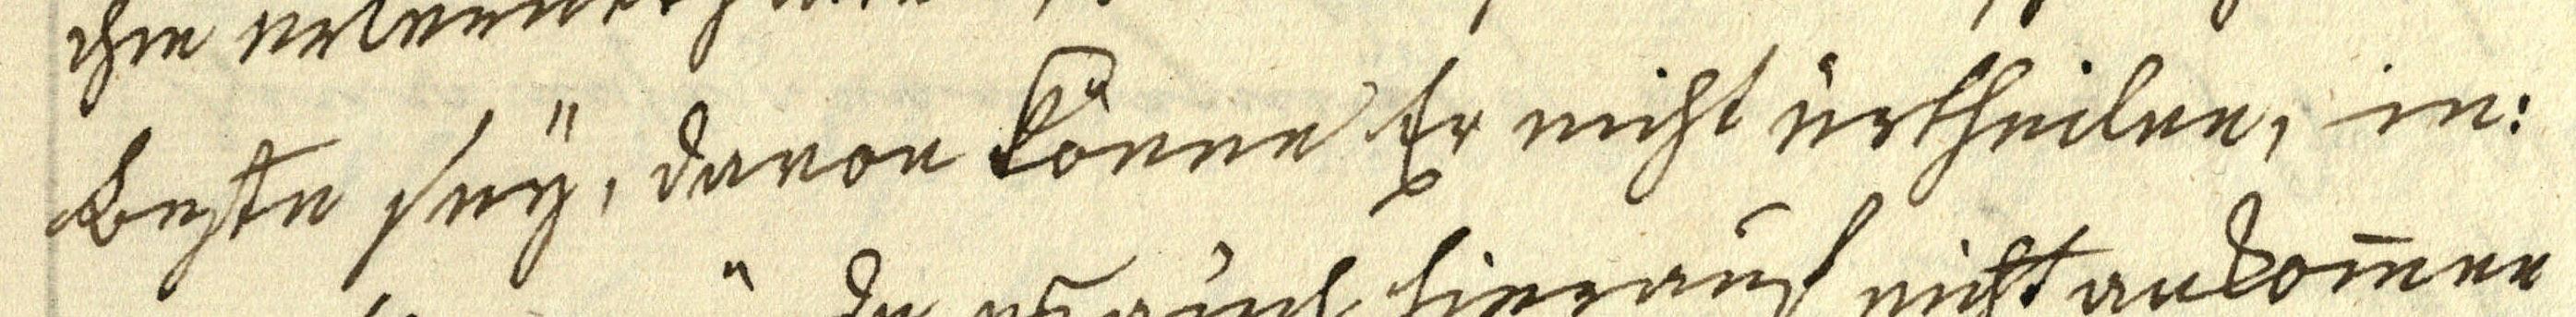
beste seÿ, davon könne Er nicht urtheilen, in¬
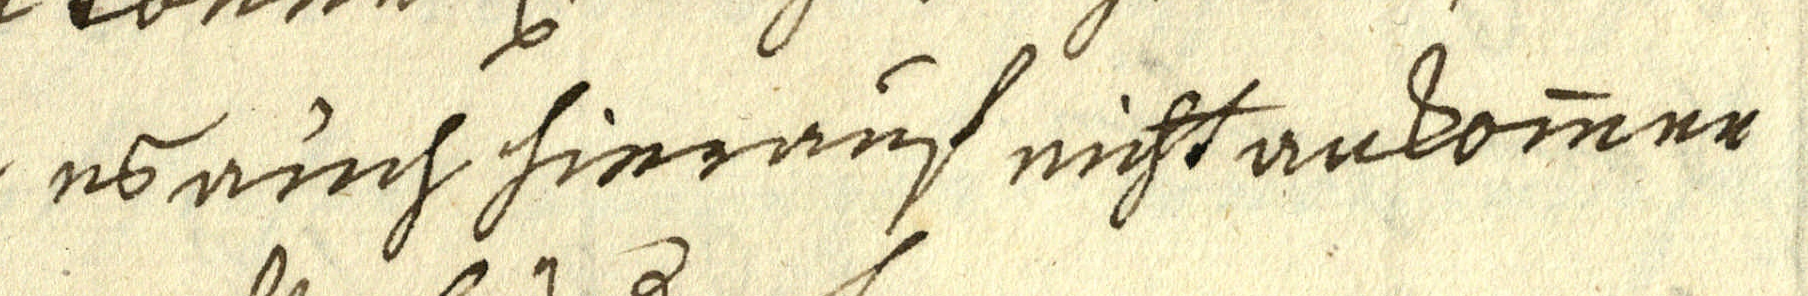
zwischen würde es auch hierauf nicht ankomen
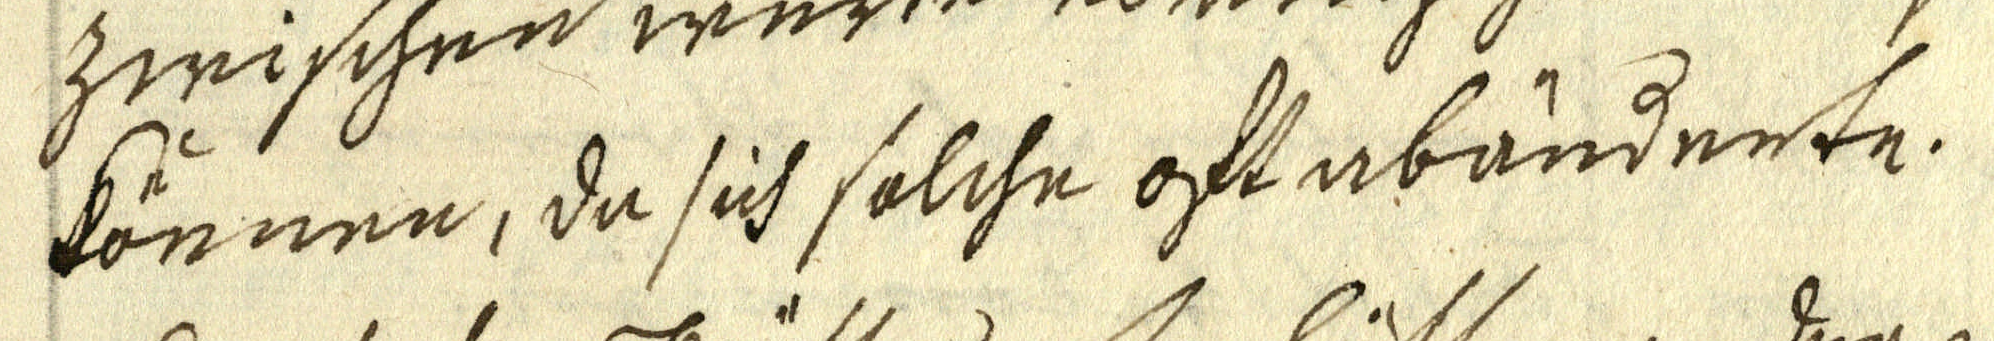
können, da sich solche oft abänderte.
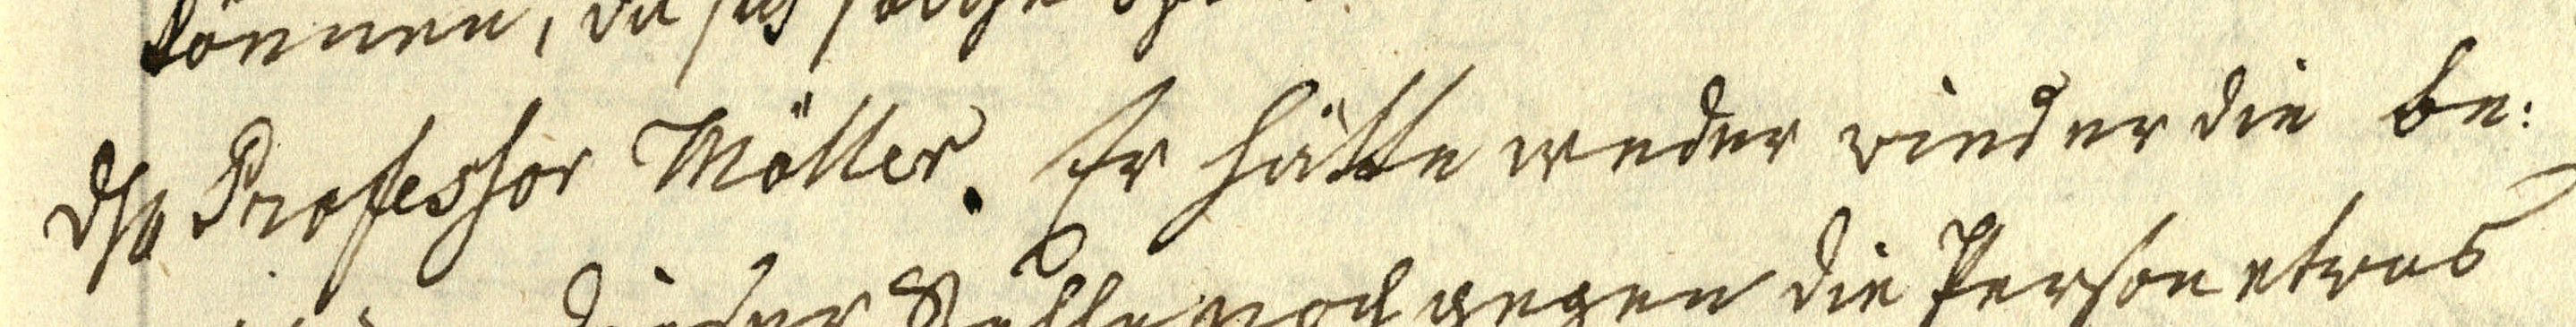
dh Professor Möller. Er hätte weder wieder die Be¬
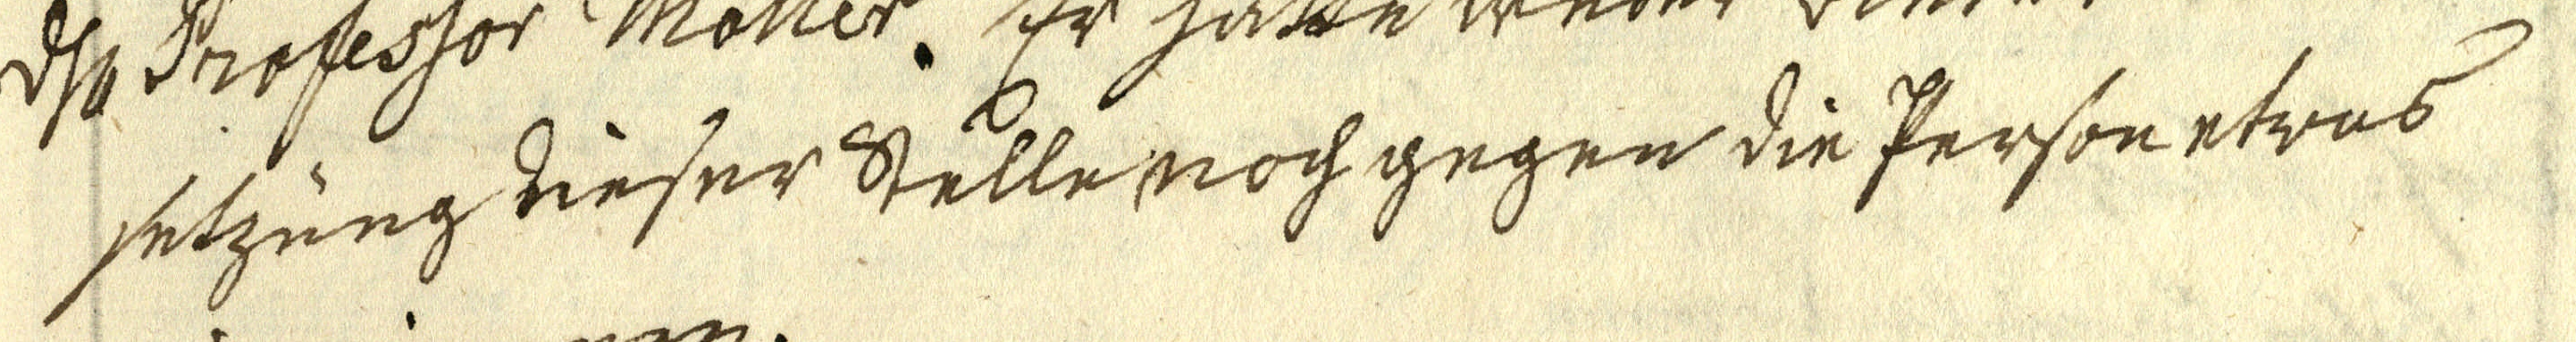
setzung dieser Stellen noch gegen die Person etwas
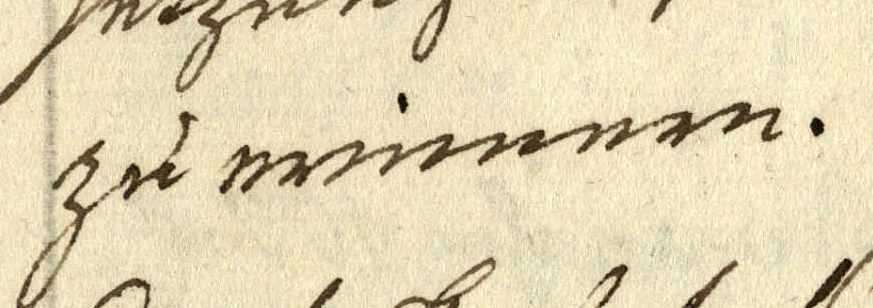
zu erinnern.
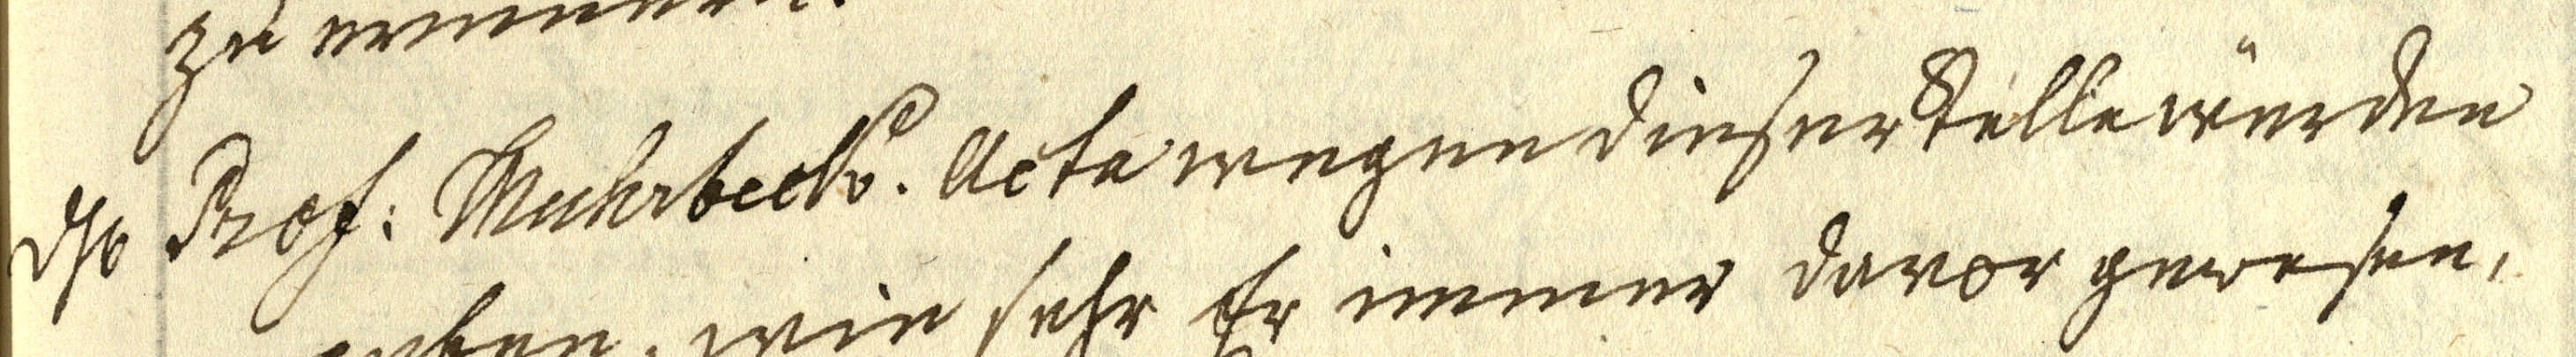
dh Prof. Muhrbeck. Acta wegen dieser Stelle würden
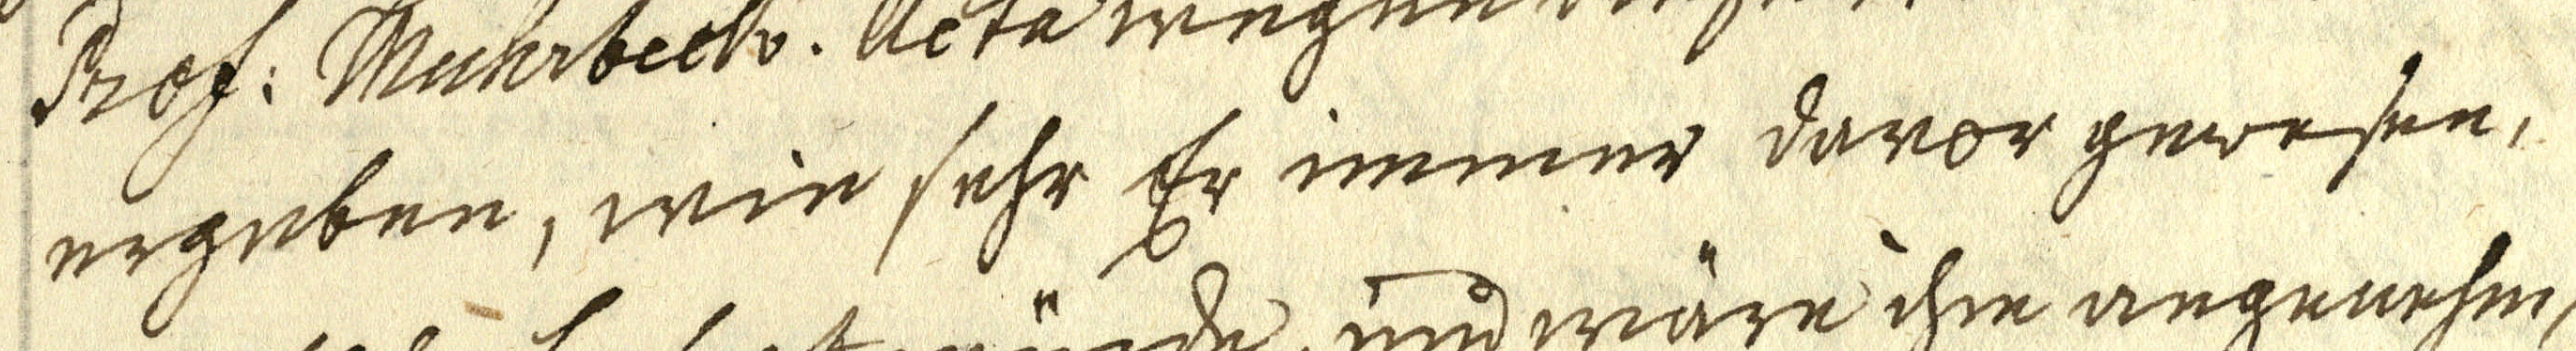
ergeben, wie sehr Er immer davor gewesen,
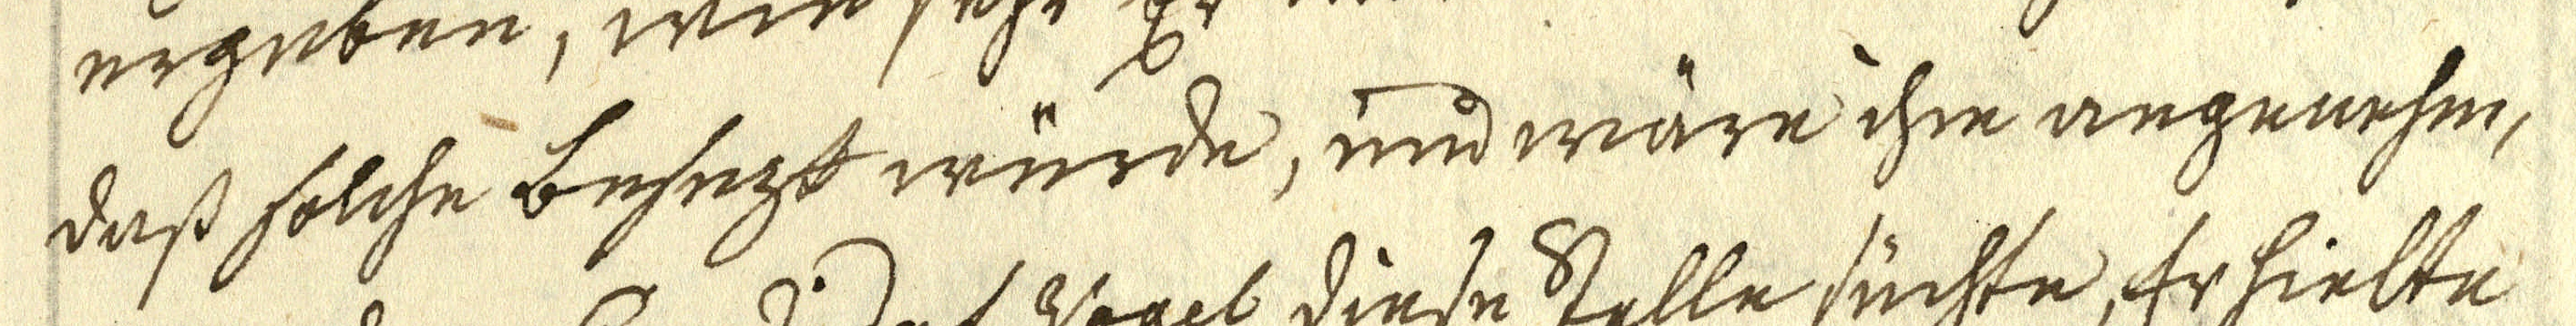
daß solche besezt würde, und wäre ihm angenehm,
